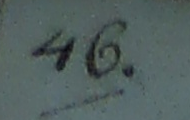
46.
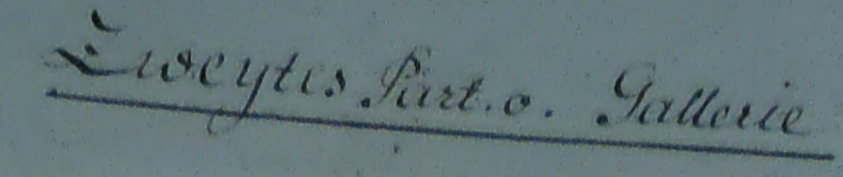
Zweytes Part. o. Gallerie
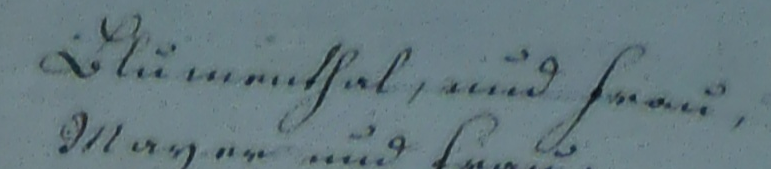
Blumenthal, und Frau,
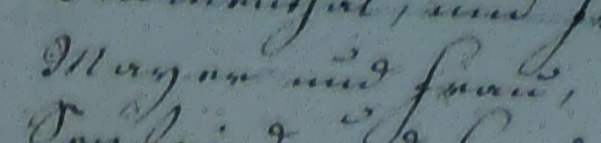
Mayer und Frau,
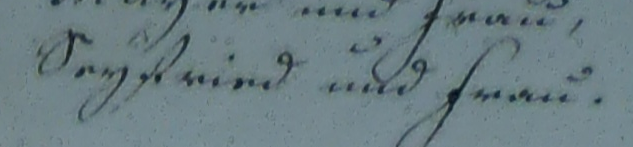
Seyfried und Frau.
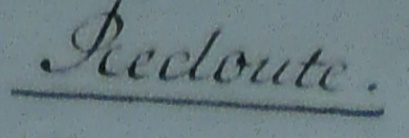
Redoute.
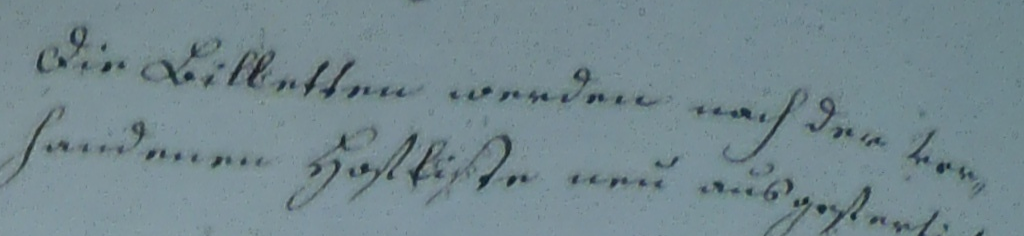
Die Billetten werden nach der vor¬
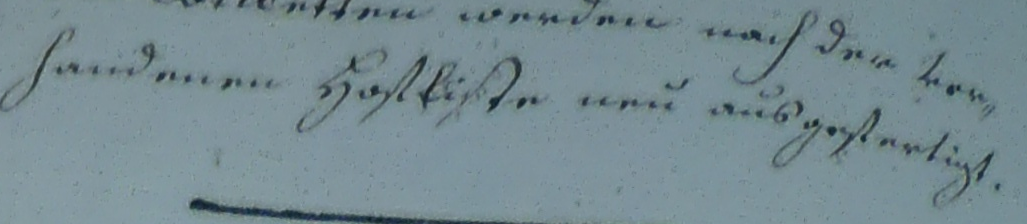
handenen Hofliste neu ausgefertigt.
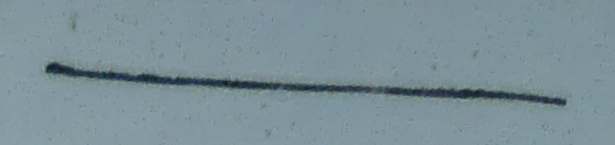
_____________________________
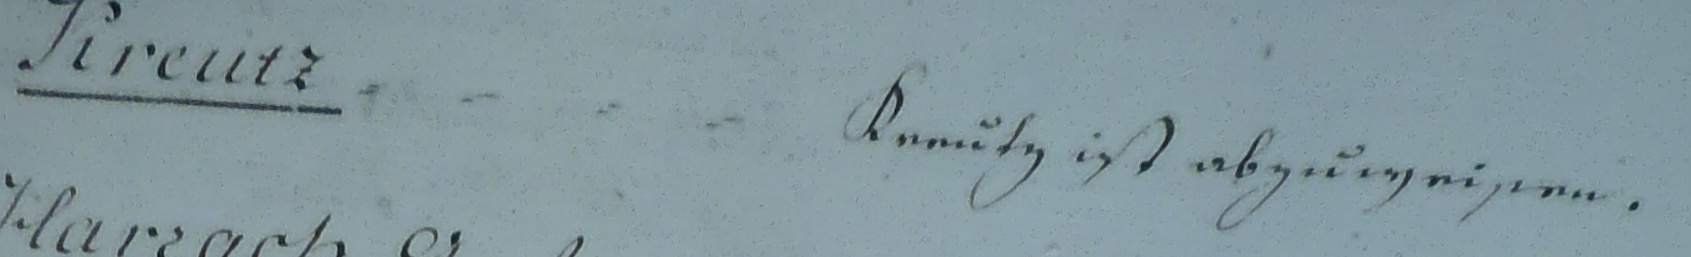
Kreutz : : : : Kreutz ist abzuweisen.
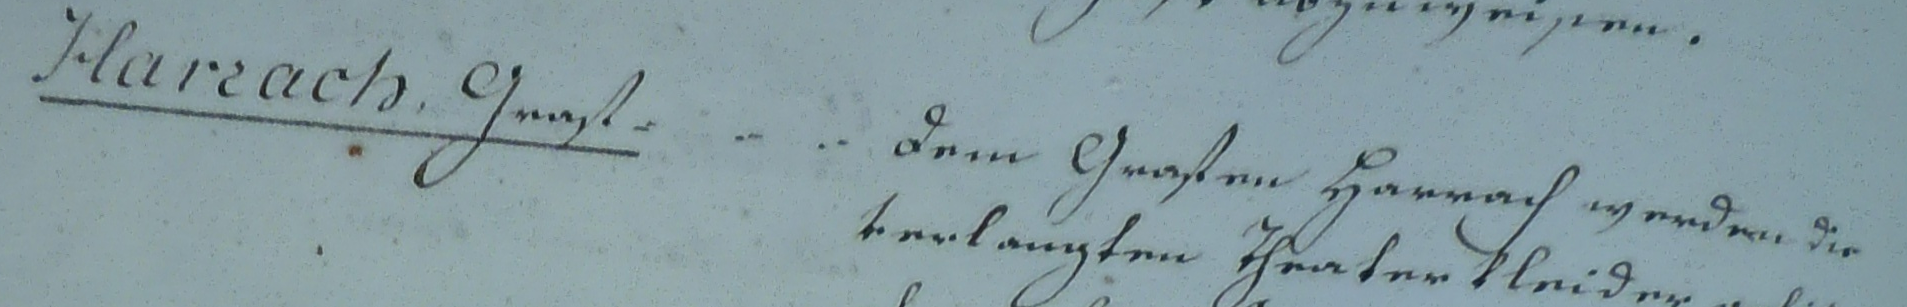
Harrach, Graf : : : Dem Grafen Harrach werden die
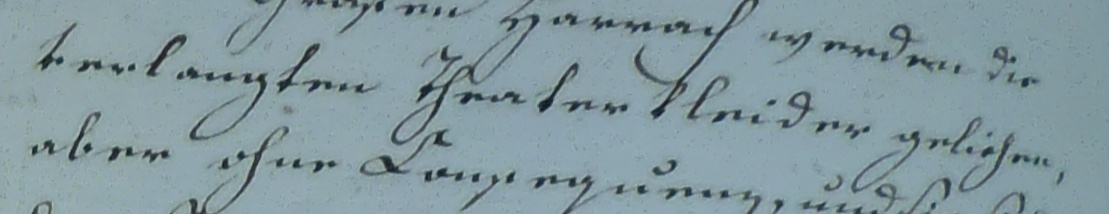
verlangten Theater Kleider geliehen,
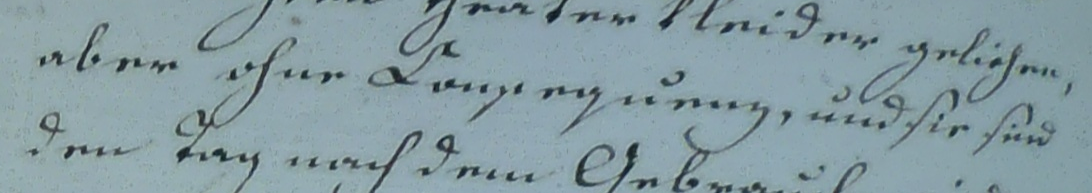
aber ohne Consequenz, und sie sind
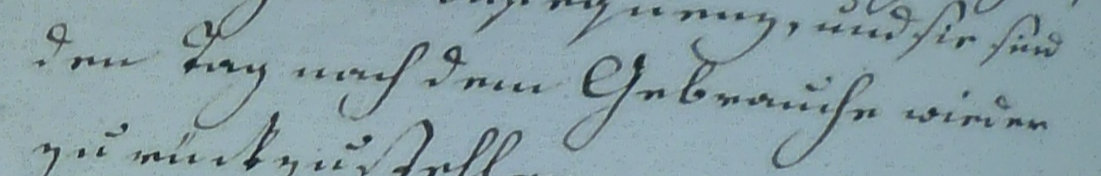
den Tag nach dem Gebrauche wieder
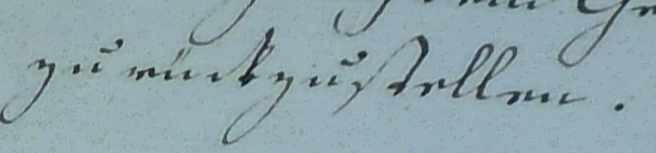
zurückzustellen.
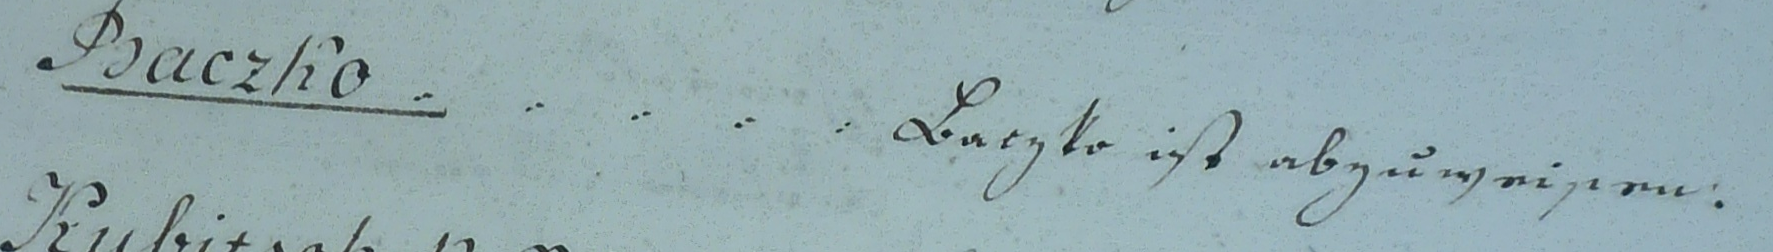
Baczko : : : : : Baczko ist abzuweisen.
